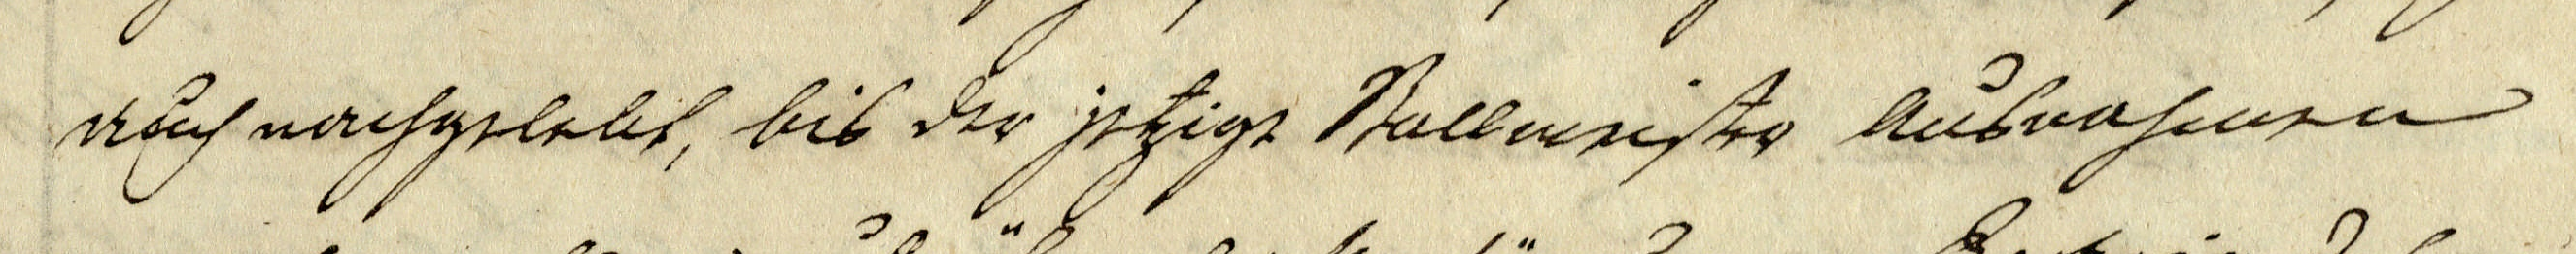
auch nachgelebt, bis der jetzige Stallmeister Ausnahmen
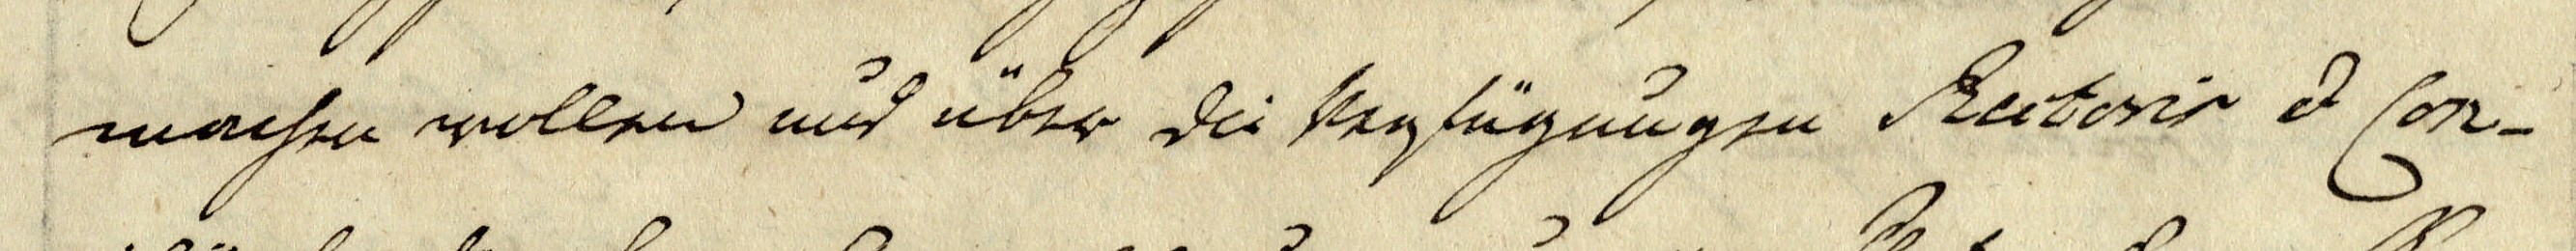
machen wollen und über die Verfügungen Rectoris et Con¬
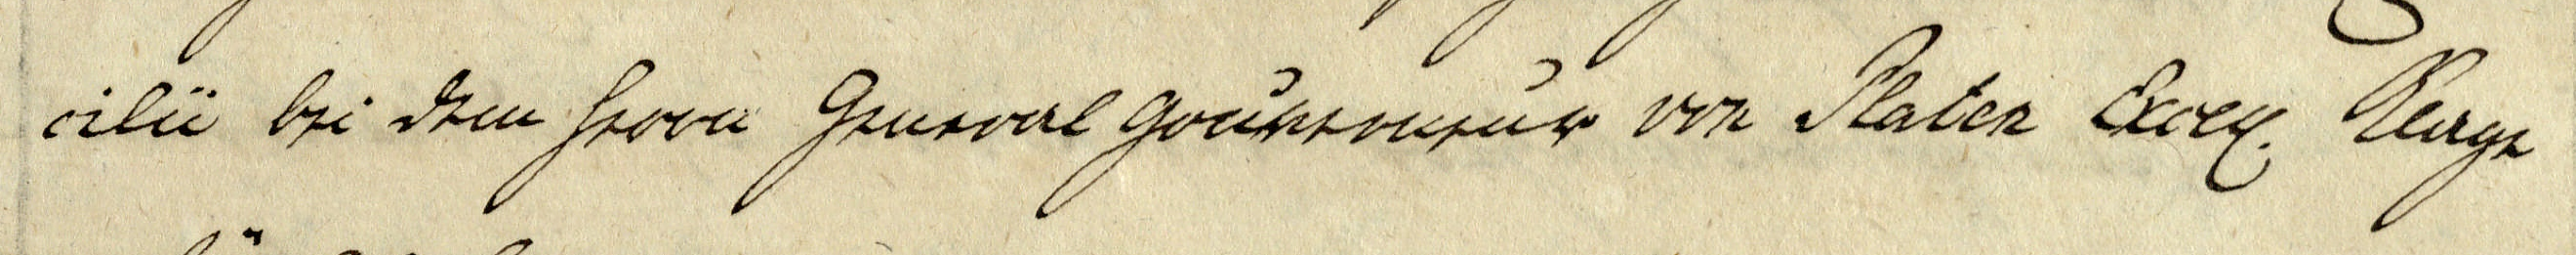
cilii bei dem Herrn General Gouverneur von Platen Excell. Klage
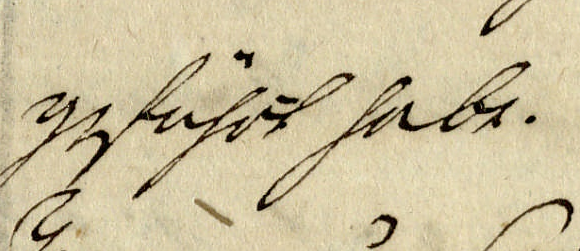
geführt habe.
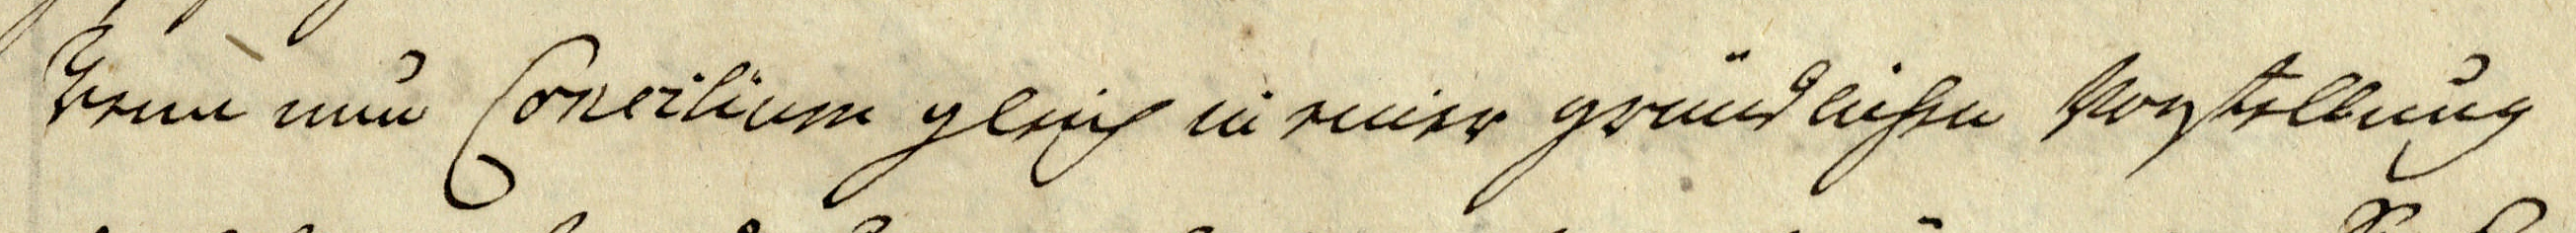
Wenn nun Concilium gleich in einer gründlichen Vorstellung
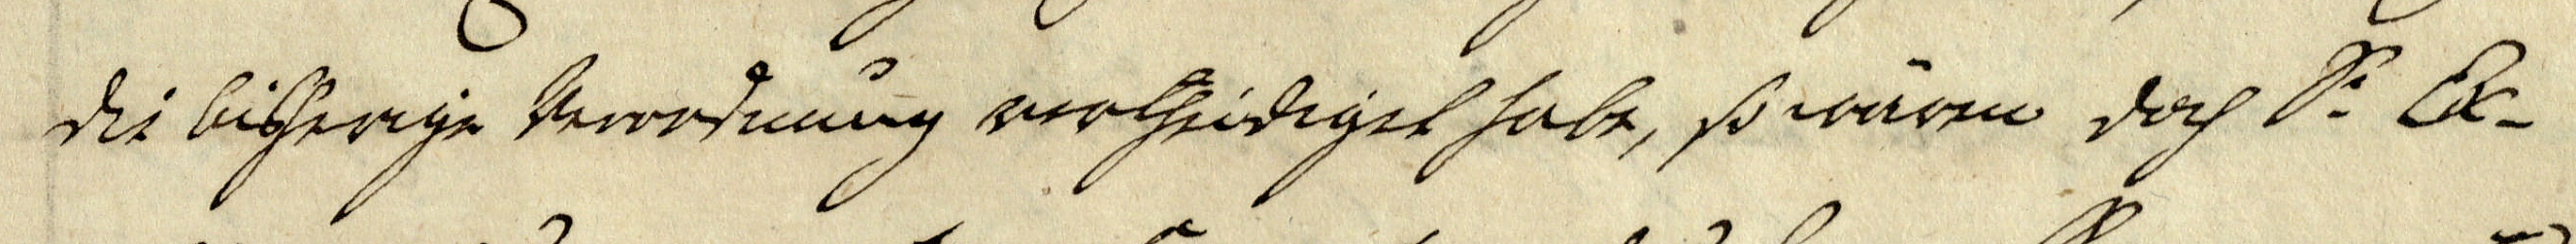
die bisherige Verordnung vertheidiget habe, so wären doch Sr. Ex¬
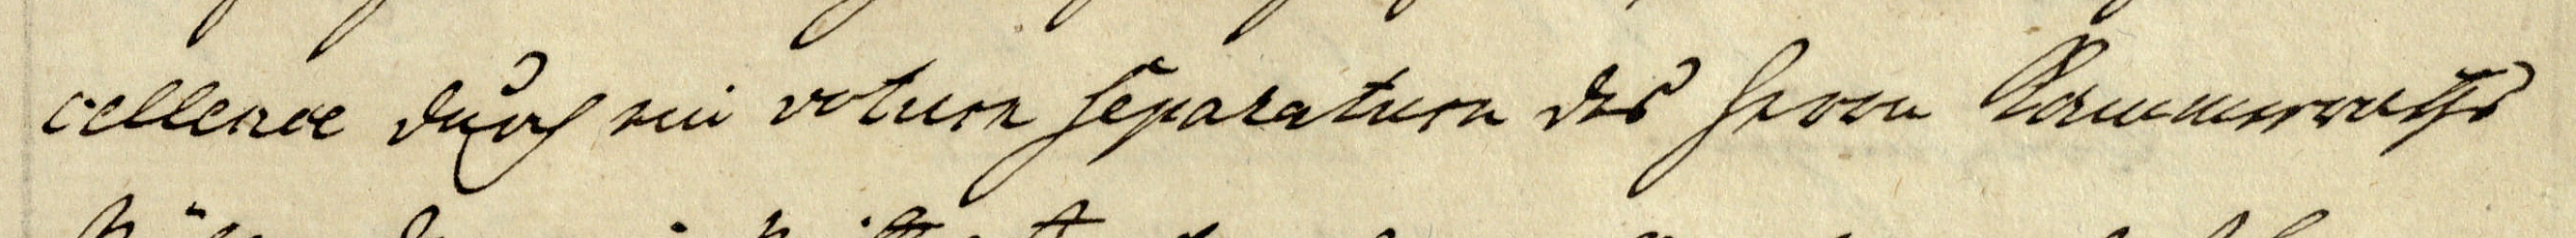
cellence durch ein votum separatum des Herrn Kammerraths
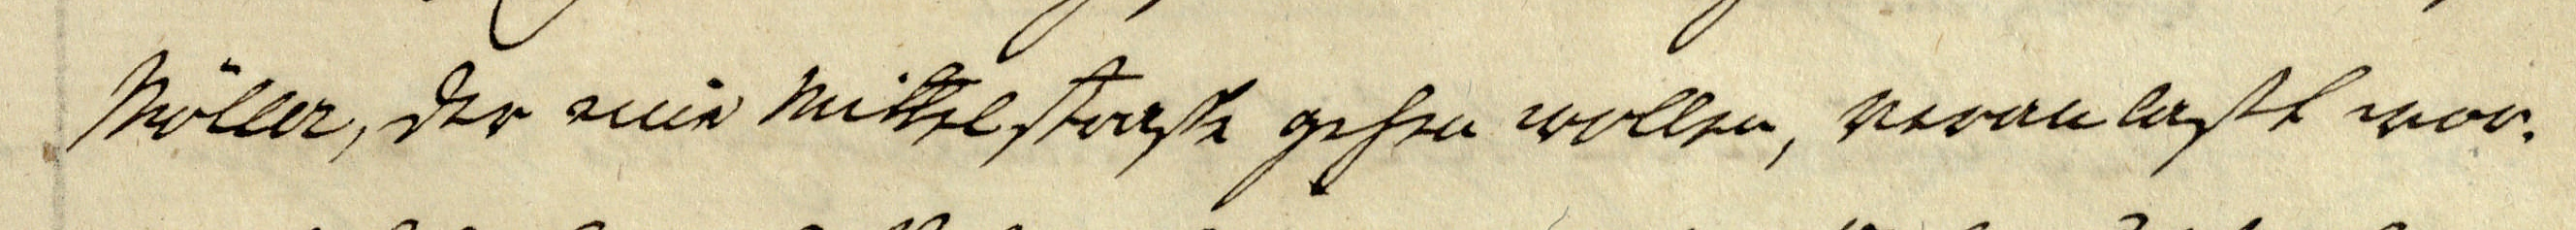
Möller, der eine Mittelstrasse gehen wollen, veranlaßt wor¬
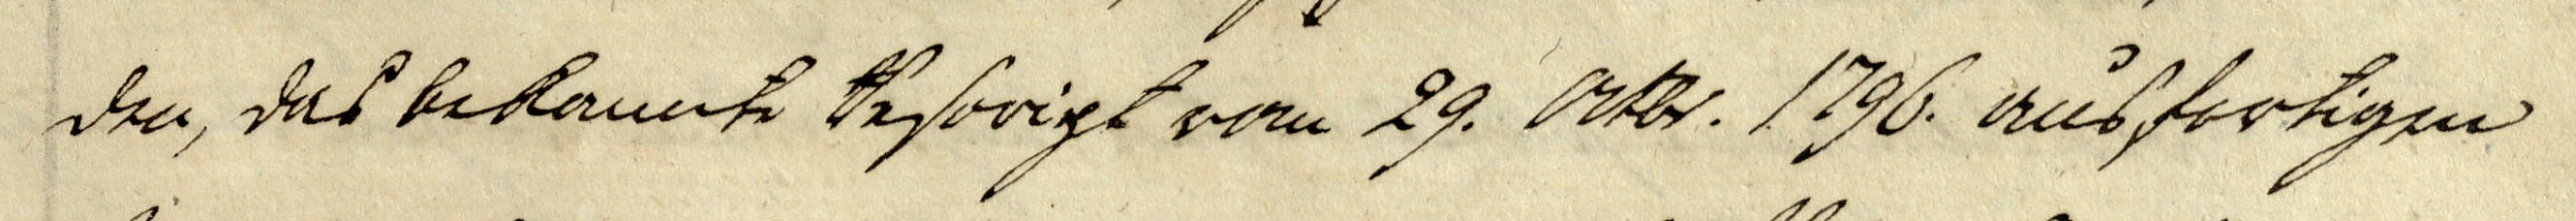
den, das bekannte Rescript vom 29. Octbr. 1796. ausfertigen
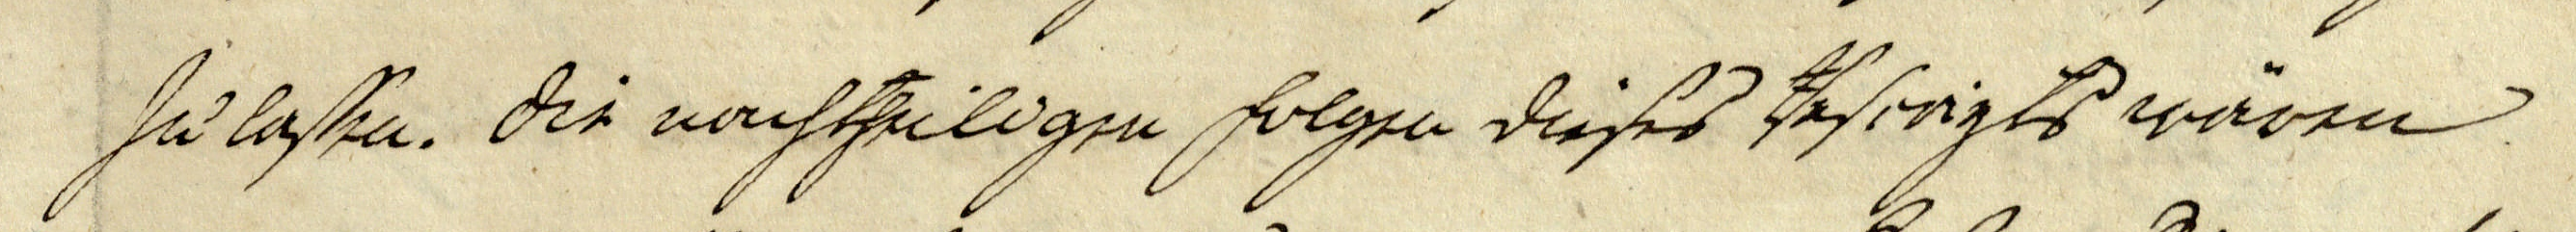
zu lassen. Die nachtheiligen Folgen dieses Rescripts wären
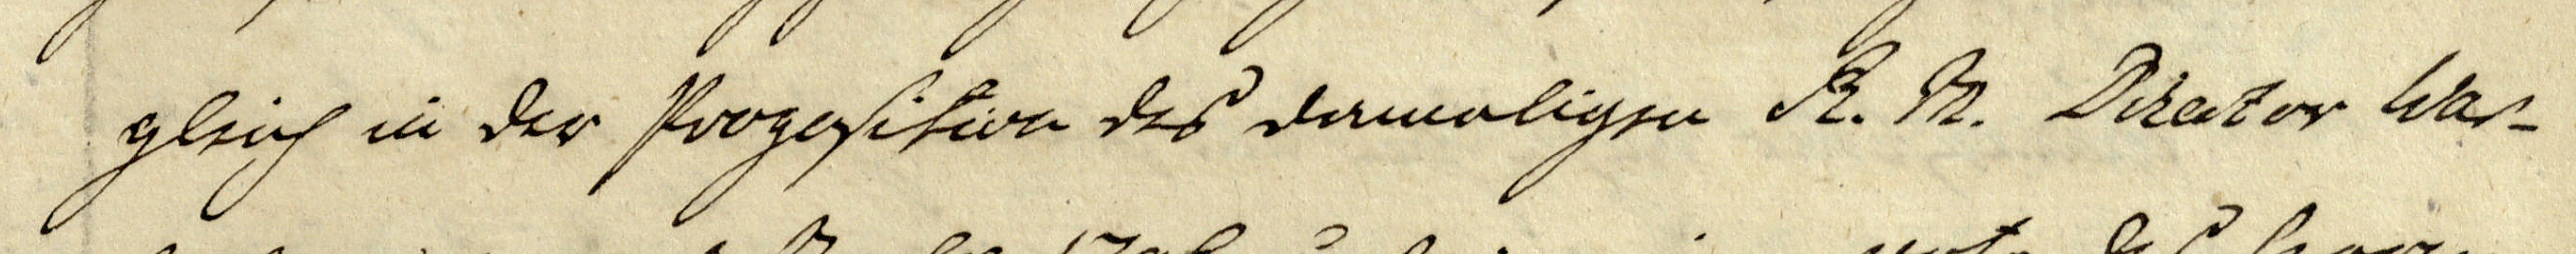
gleich in der Proposition des damaligen R. M. Director War¬
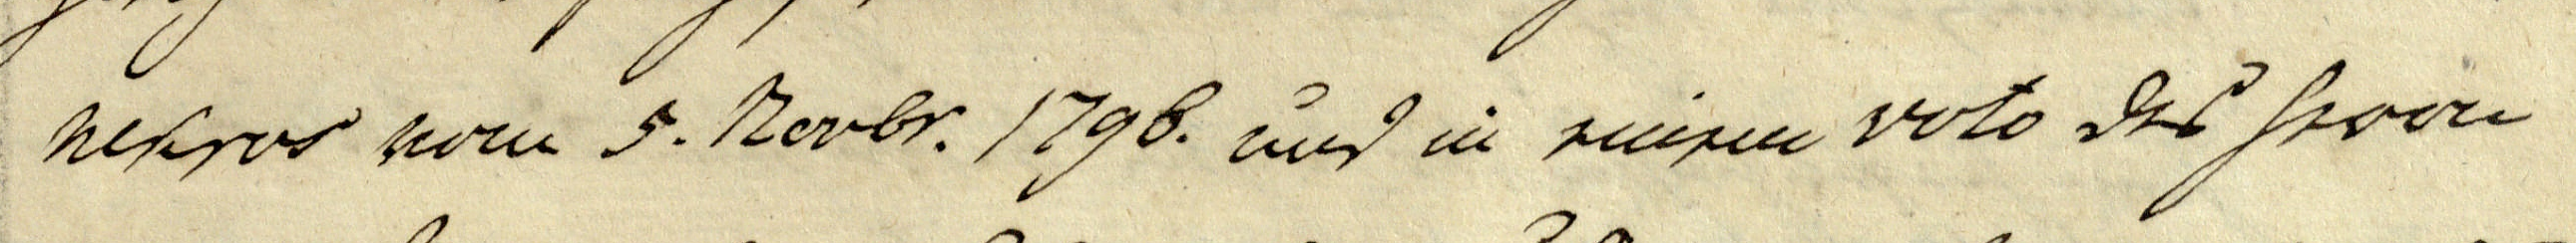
nekros vom 5. Novbr. 1796. und in einem voto des Herrn
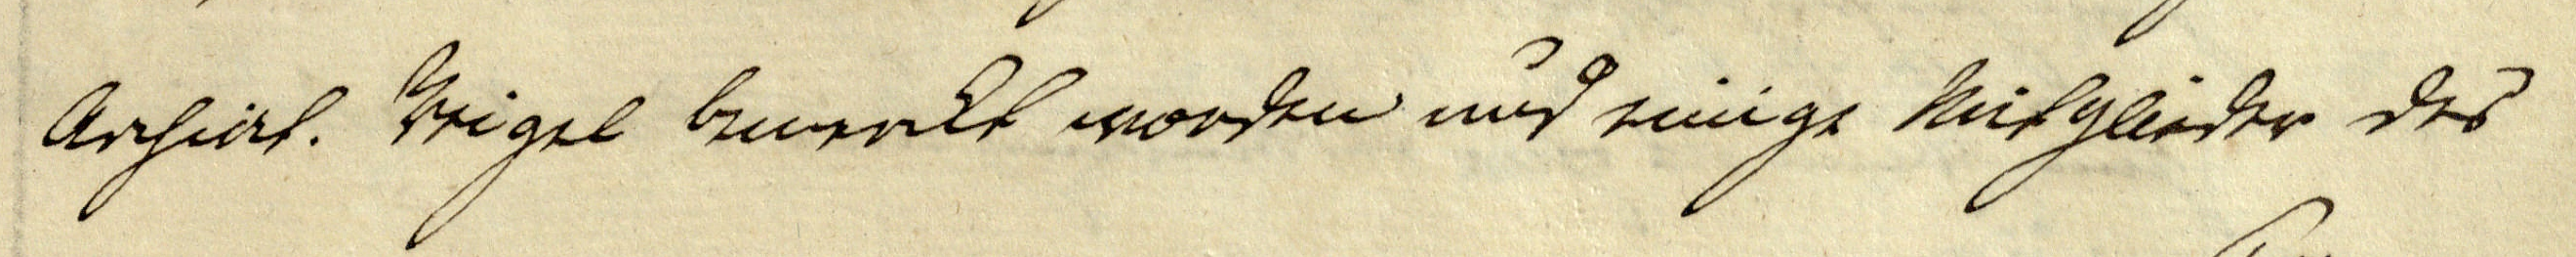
Archiat. Weigel bemerckt worden und einige Mitglieder des
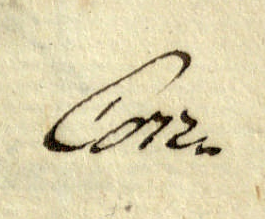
Con¬
